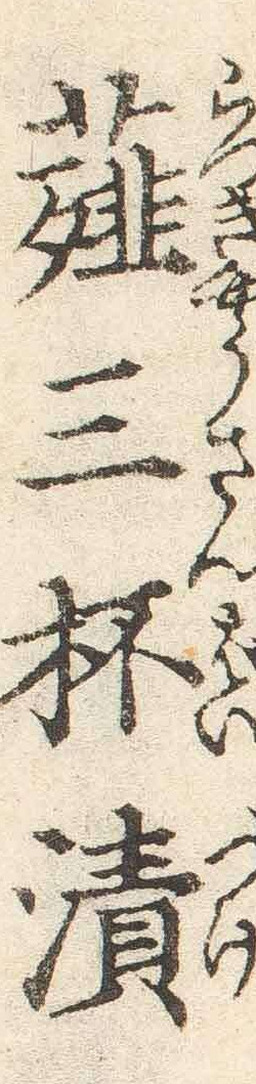薤三杯漬
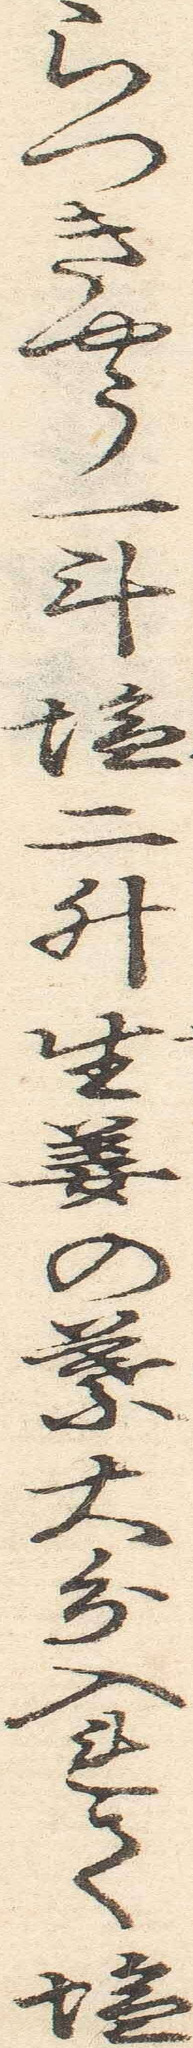らつきやう一斗塩二升生姜の葉大分入れて塩
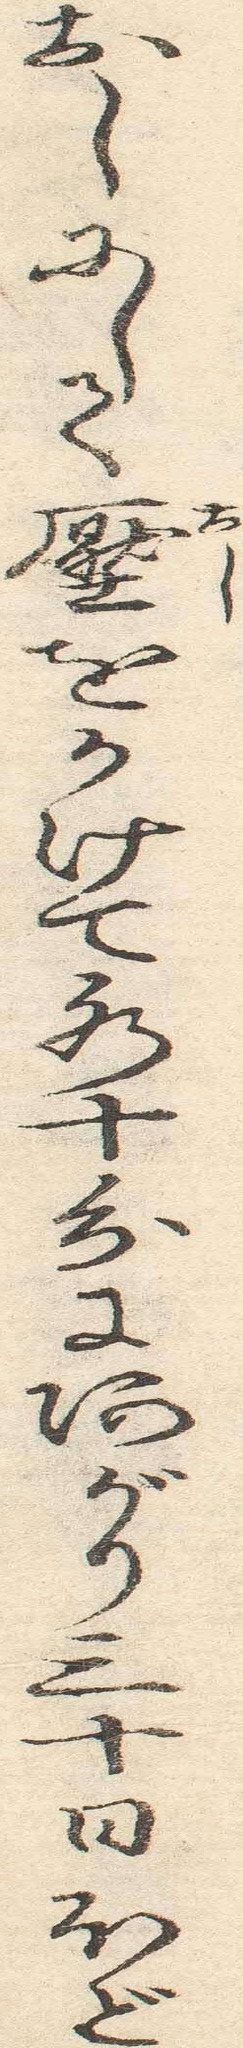おしにして圧をかけて水十分にあがり三十日ほど
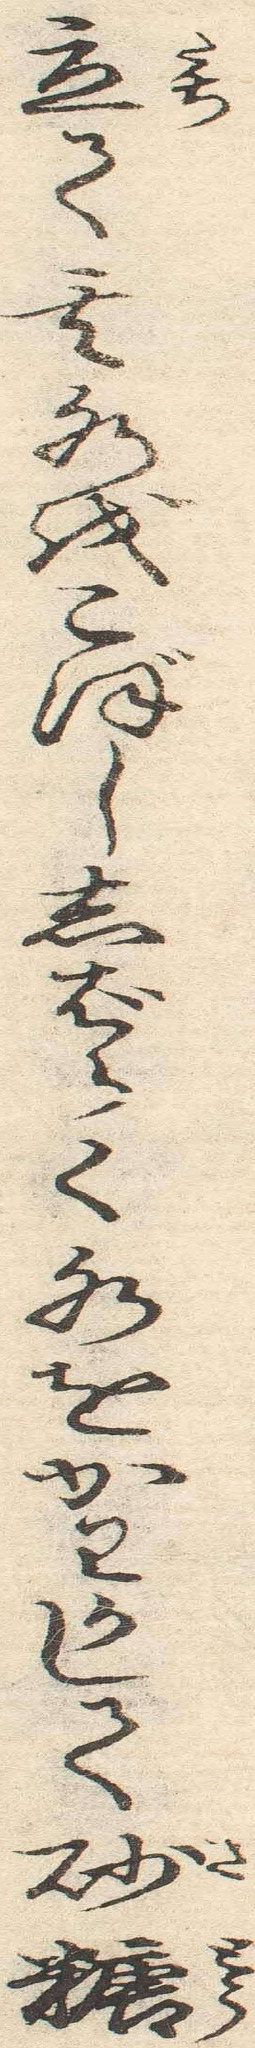立て其水をこぼししばらく水をかわかして砂糖

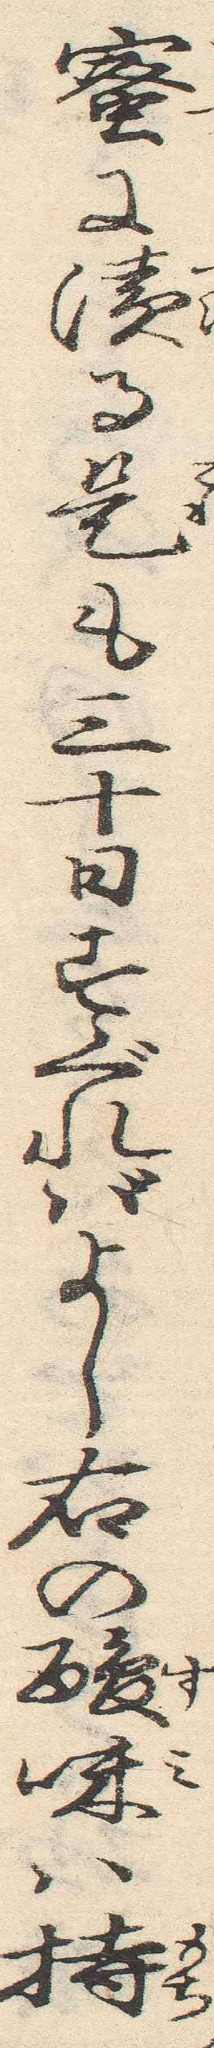蜜に漬る是も三十日すればよし右の酸味は持
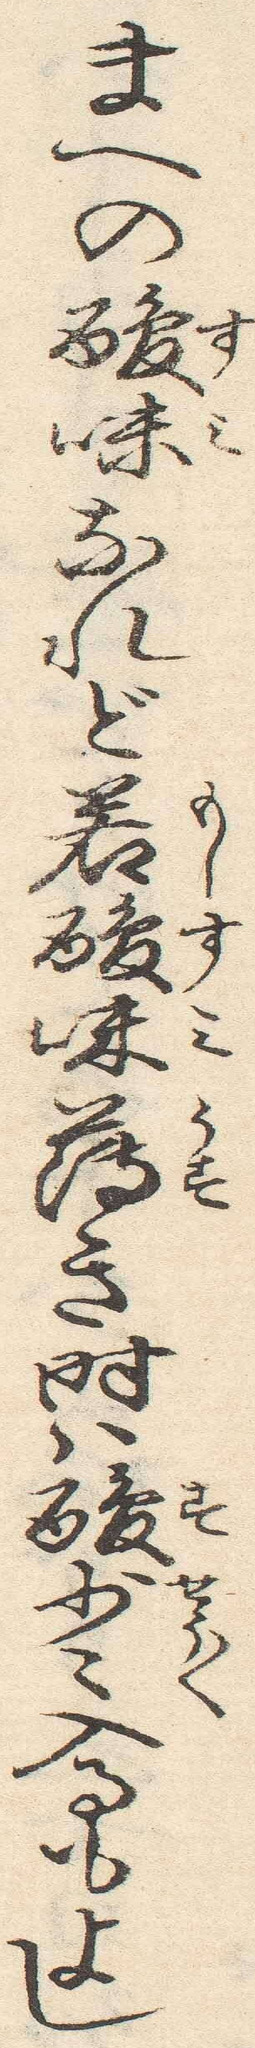まへの酸味なれど若酸味薄き時は酸少々入るもよし
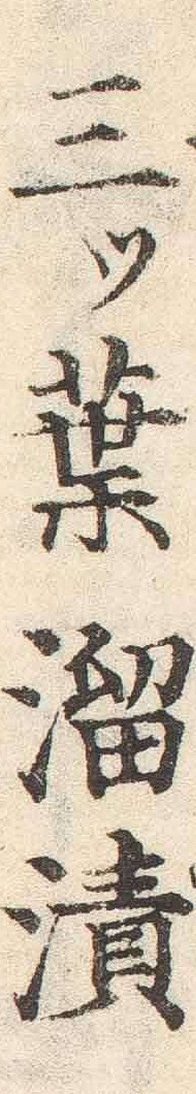三ッ葉溜漬
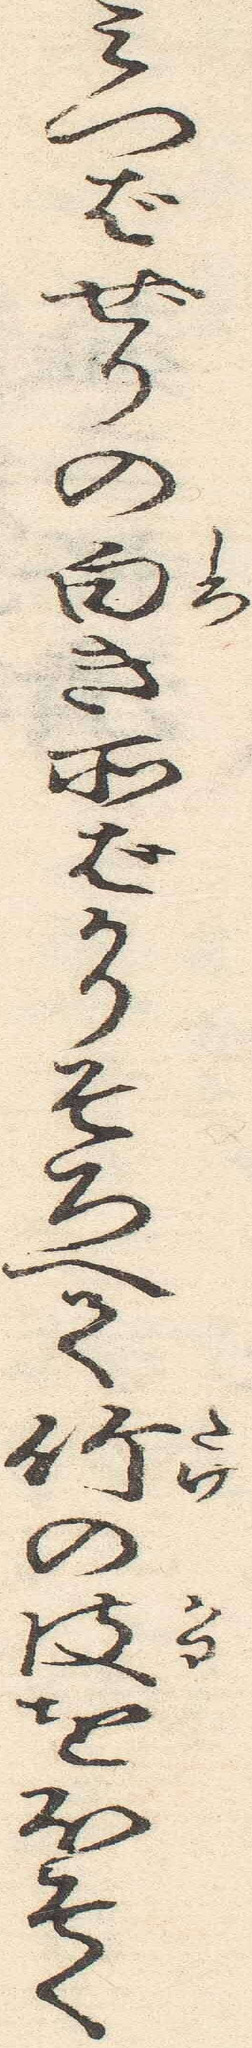みつばせりの白き所ばかりそろへて竹の皮をほそく
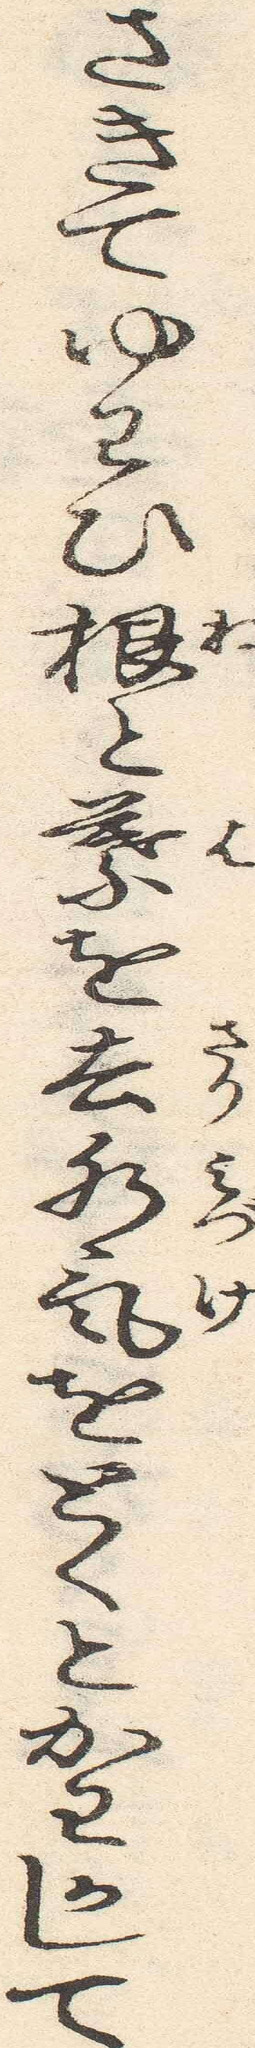さきてゆわひ根と葉を去水気をとくとかわかして
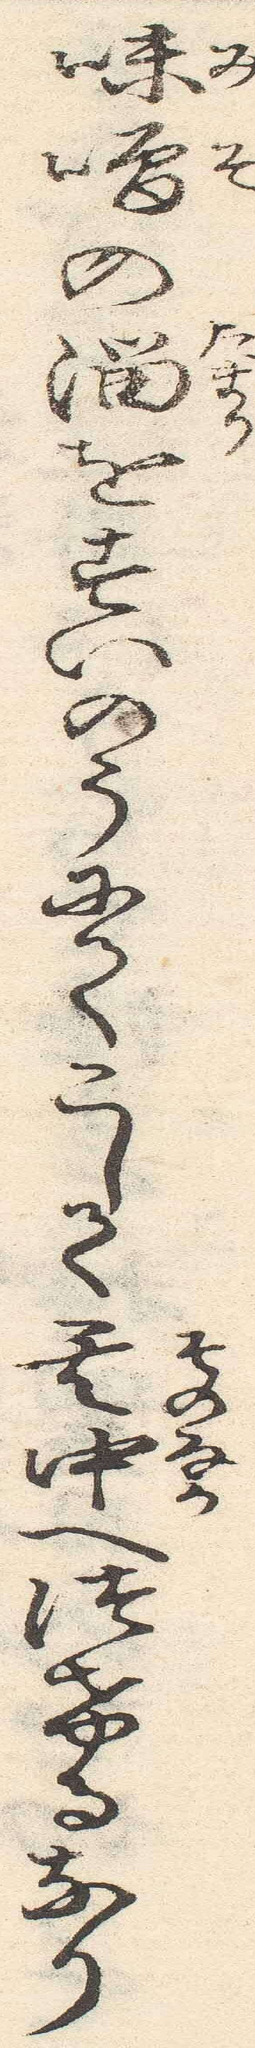味噌の溜をすいのうにてこして其中へつけるなり
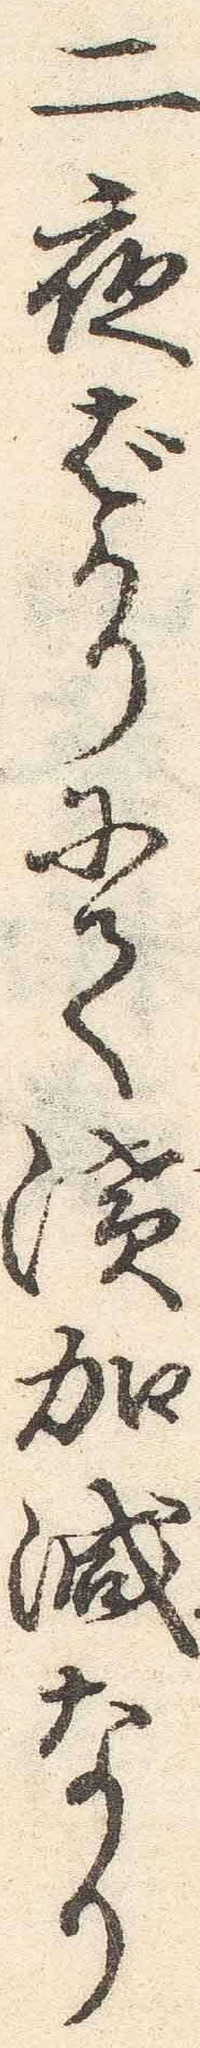二夜ばかりにて漬加減なり
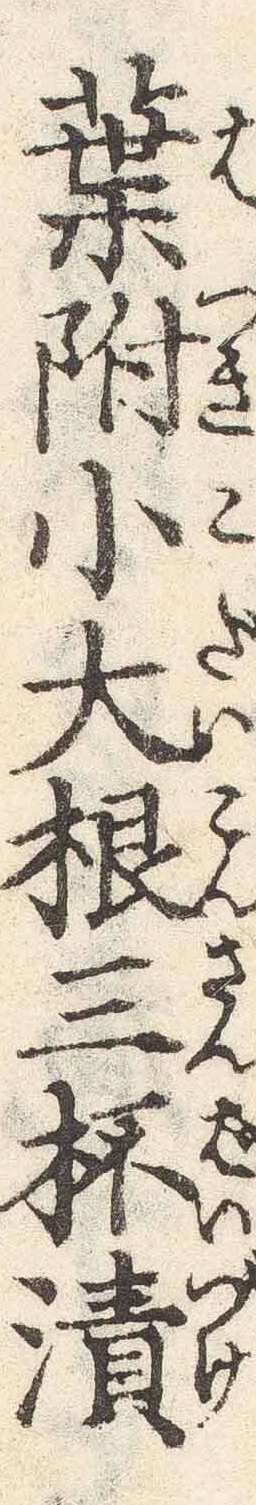葉附小大根三杯漬
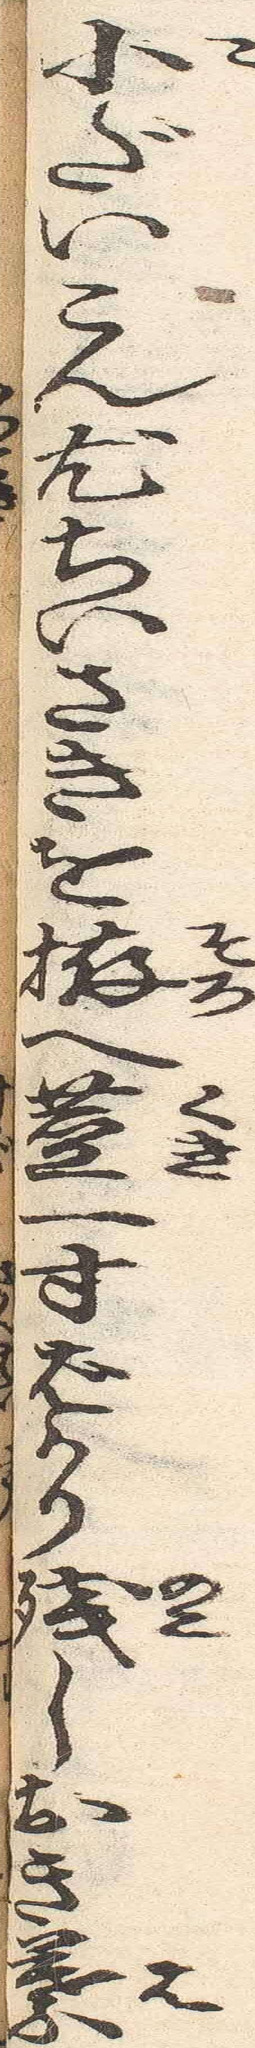小だいこん尤ちいさきを拵へ茎一寸ばかり残しおき葉
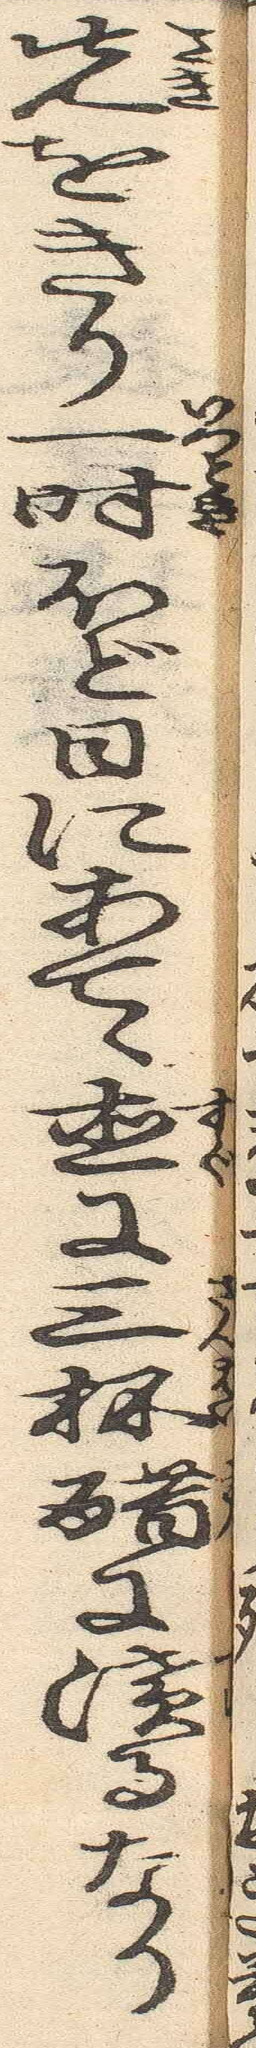先をきり一時ほど日にあてゝ直に三杯醋に漬るなり
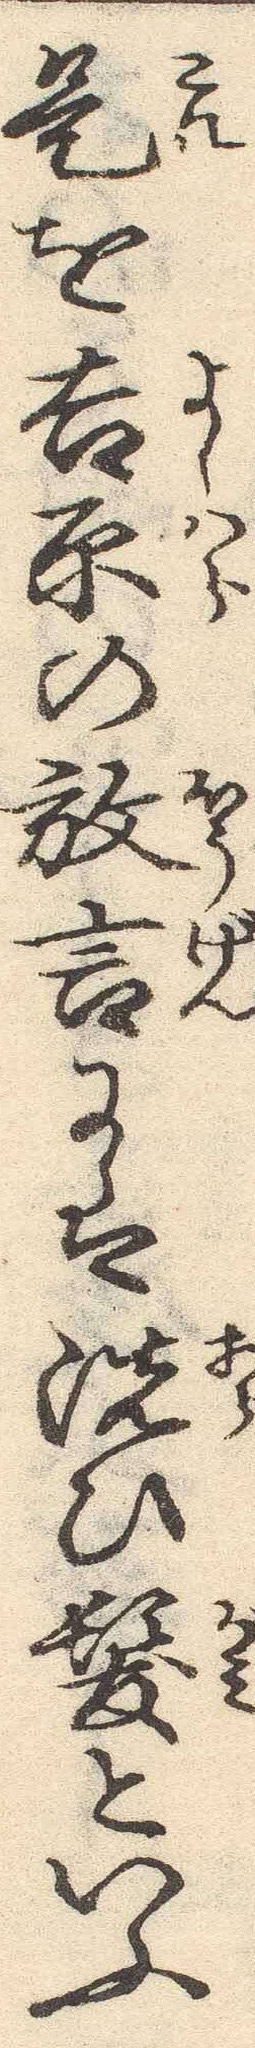是を吉原の放言には洗ひ髪といふ
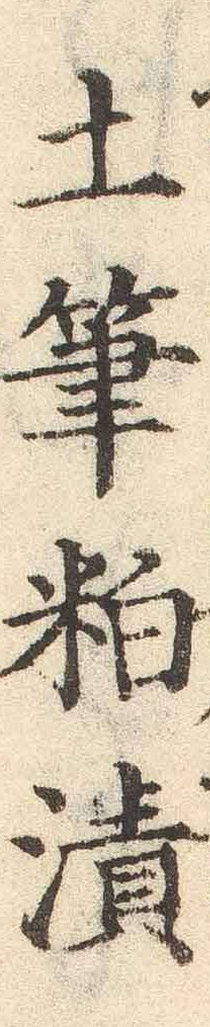土筆粕漬
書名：四季漬物塩嘉言
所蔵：東京学芸大学附属図書館 国文学研究資料館
